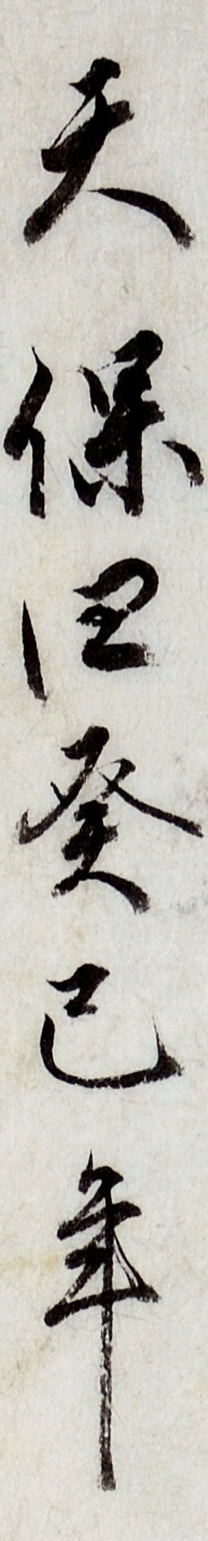天保四癸巳年
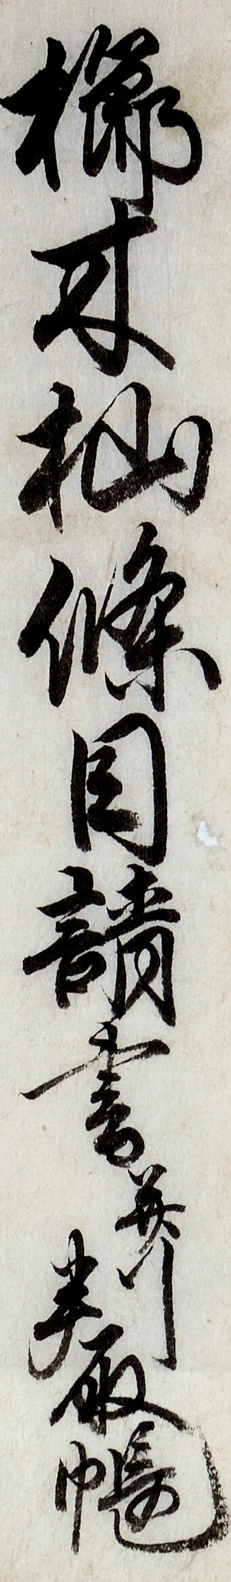櫛木杣條目請書并判取帳
